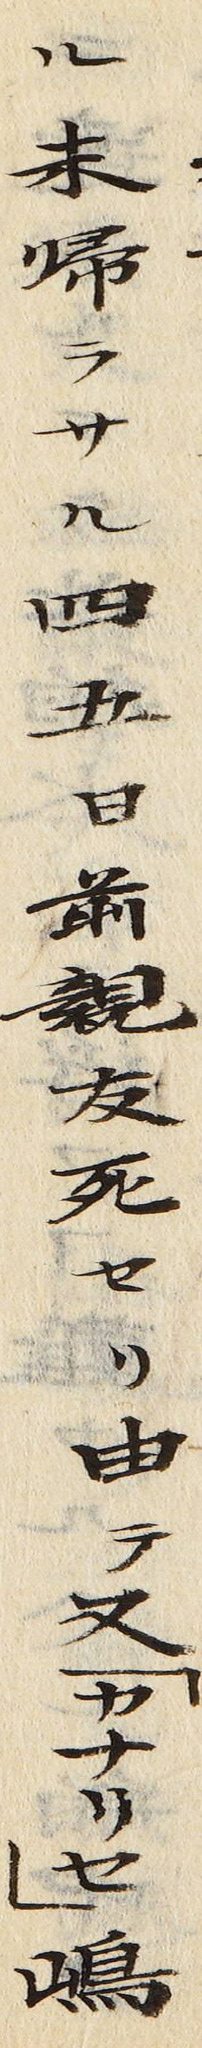ル未帰ラサル四五日前親友死セリ由テ又「カナリセ」島
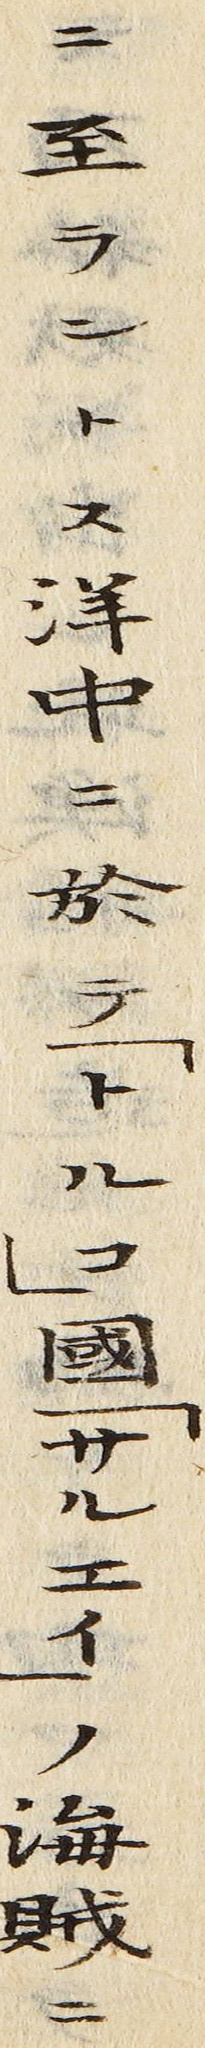ニ至ラントス洋中ニ於テ「トルコ」国「サルエイ」ノ海賊ニ
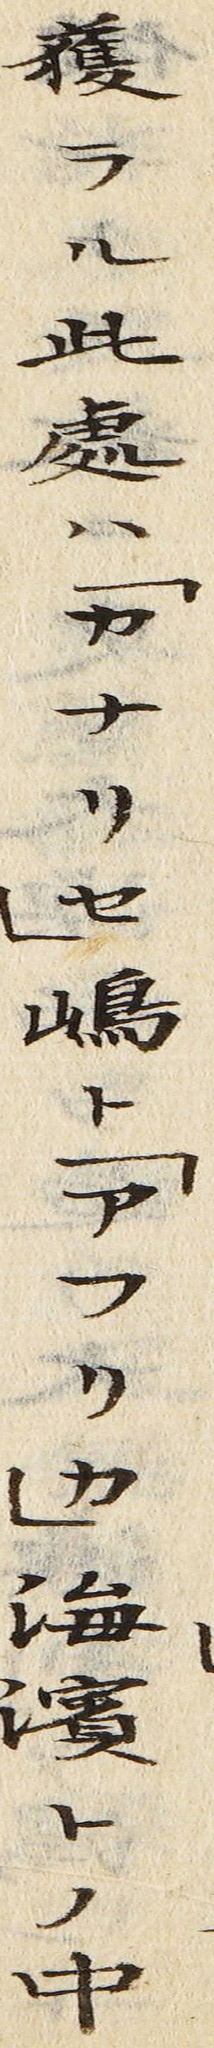獲ラル此処ハ「カナリセ」島ト「アフリカ」海浜トノ中
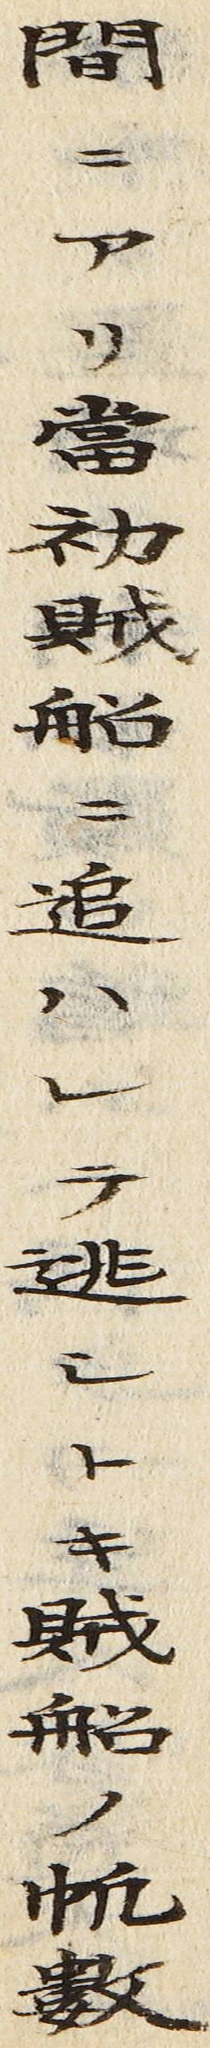間ニアリ当初賊船ニ追ハレテ逃シトキ賊船ノ帆数
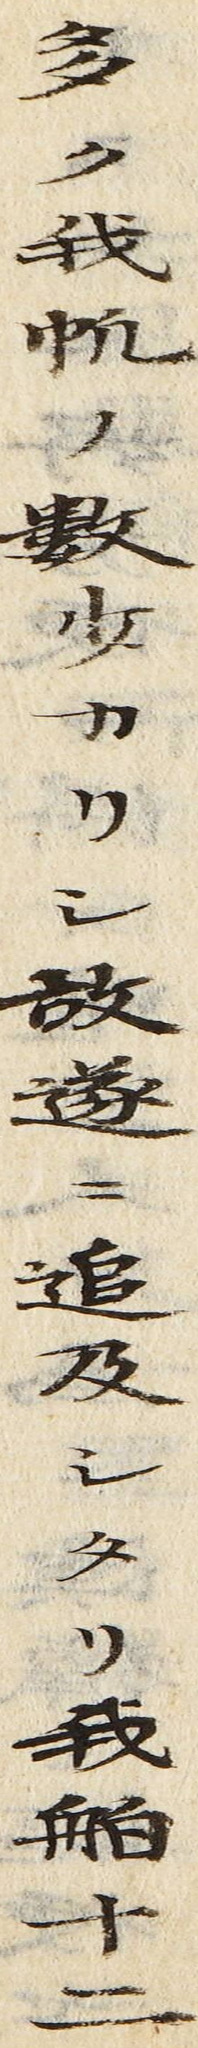多ク我帆ノ数少カリシ故遂ニ追及シタリ我舶十二
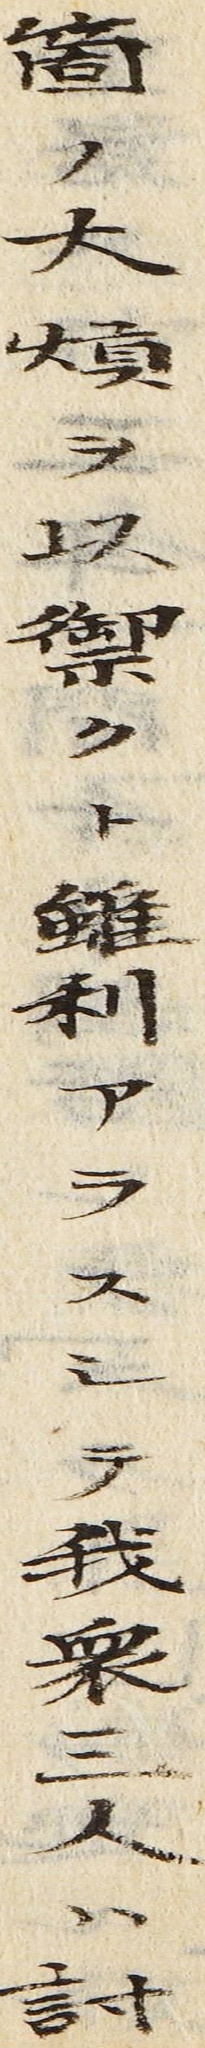箇ノ大熕ヲ以禦クト雖利アラスシテ我衆三人ハ討
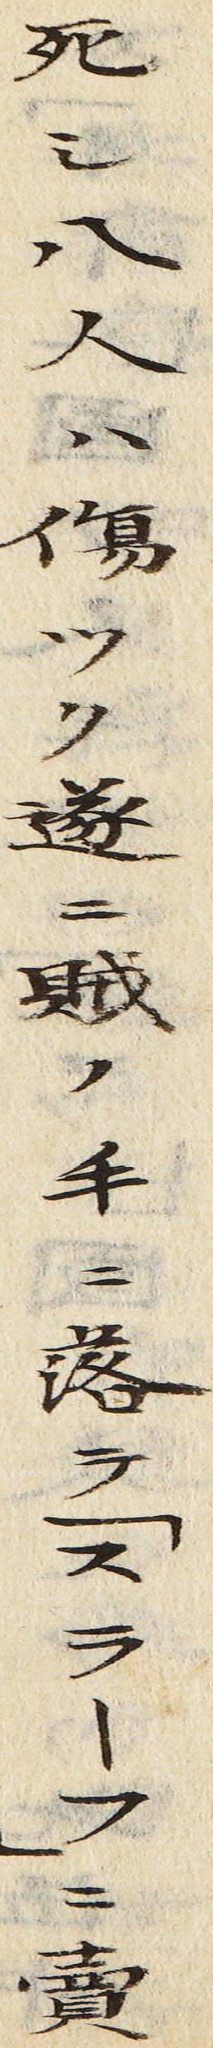死シ八人ハ傷ツク遂ニ賊ノ手ニ落テ「スラーフ」ニ売
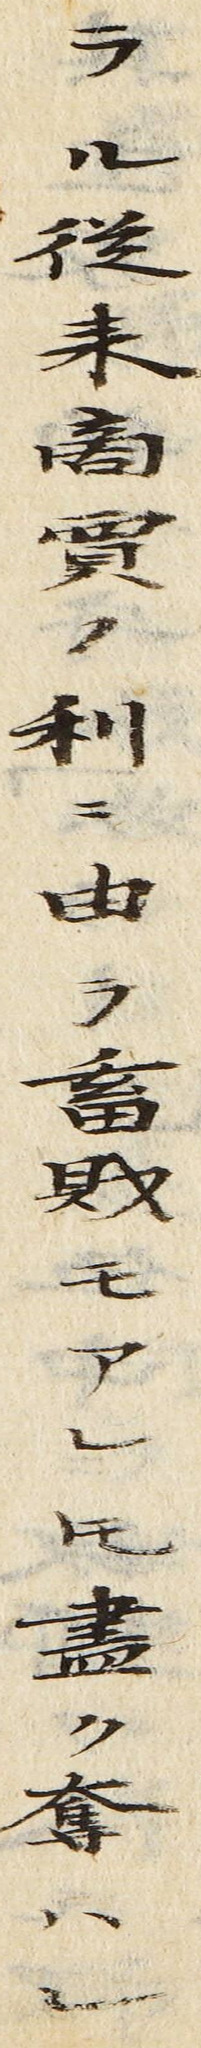ラル従来商賈ノ利ニ由テ畜財モアレトモ尽ク奪ハレ
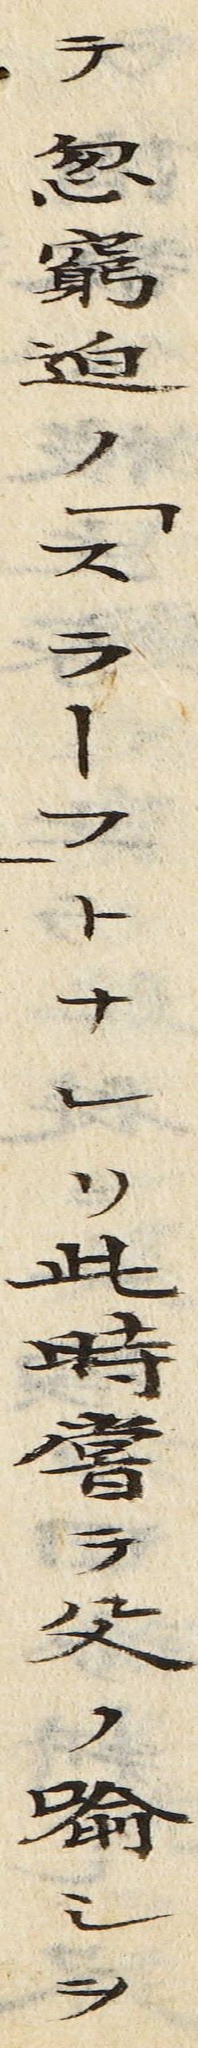テ忽窮迫ノ「スラーフ」トナレリ此時嘗テ父ノ喩シヲ
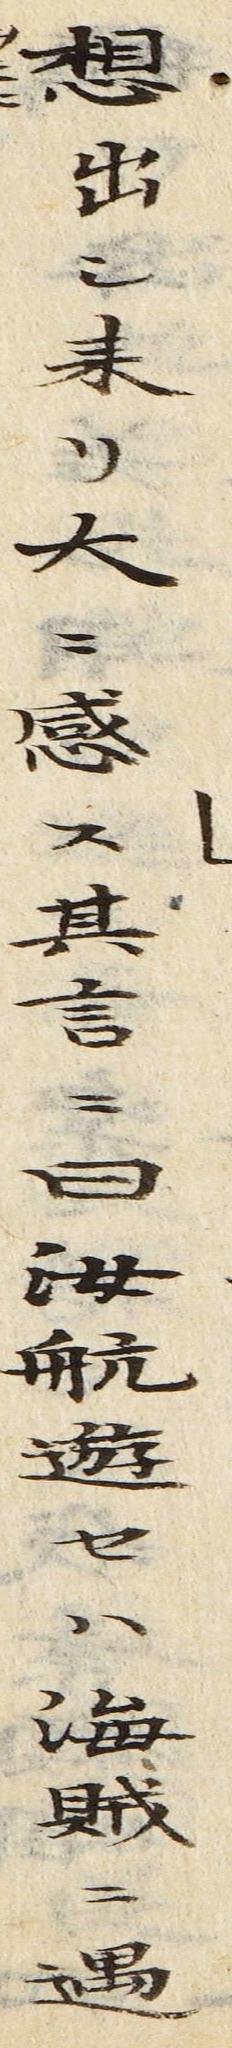想出シ来リ大ニ感ス其言ニ曰汝航遊セハ海賊ニ遇
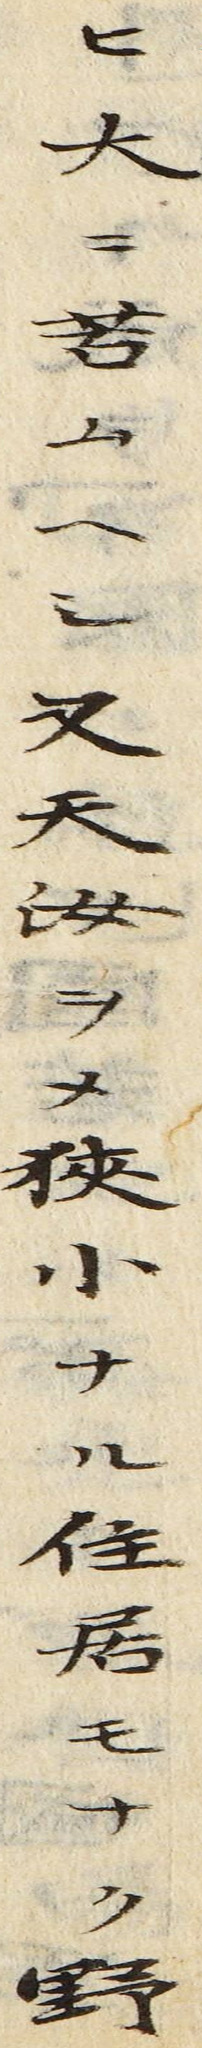ヒ大ニ苦ムヘシ又天汝ヲシテ狭小ナル住居モナク野
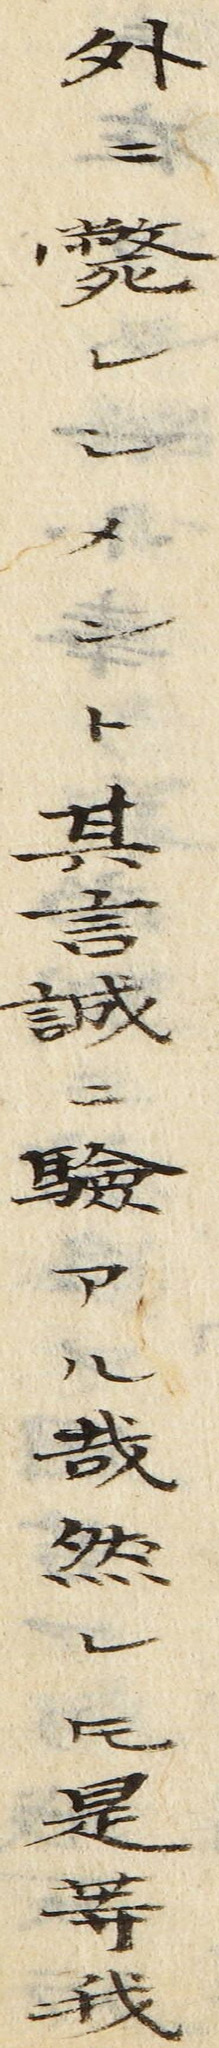外ニ斃レシメント其言誠ニ験アル哉然レトモ是等我

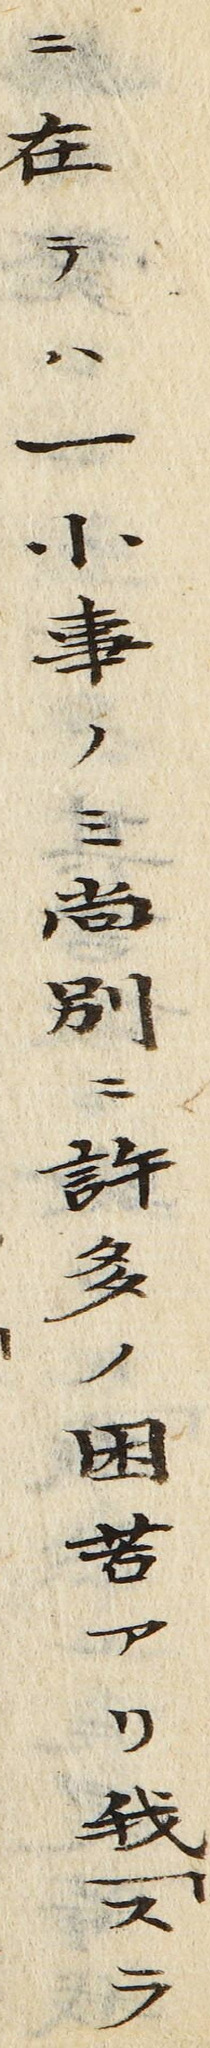二在テハ一小事ノミ尚別ニ許多ノ困苦アリ我「スラ
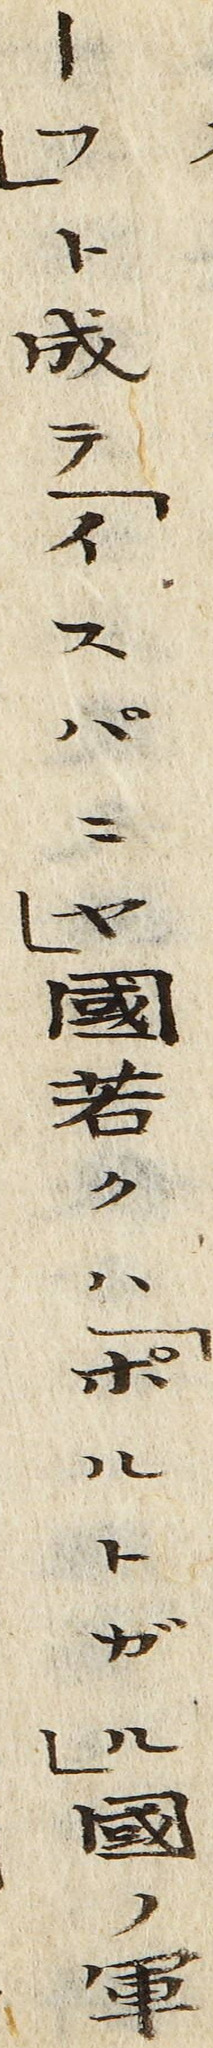ーフ」ト成テ「イスパニヤ」国若クハ「ポルトガル」国ノ軍
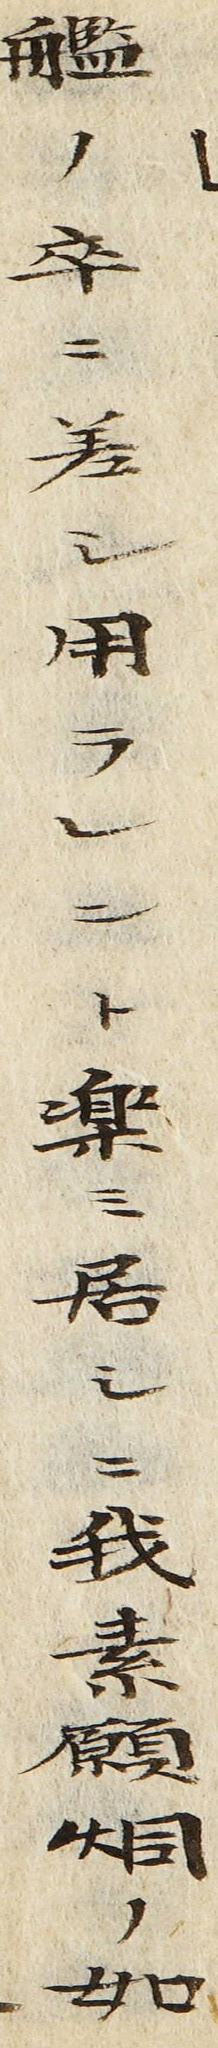艦ノ卒ニ差シ用ラレント楽ミ居シニ我素願烟ノ如
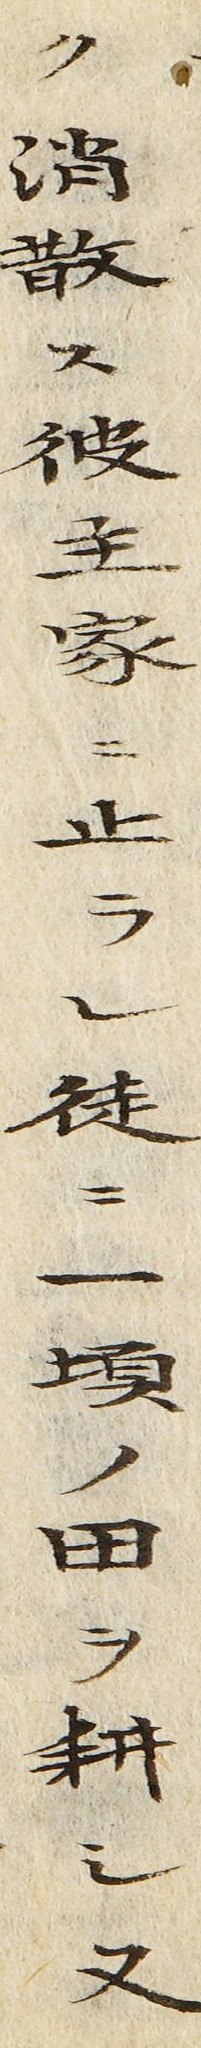ク消散ス彼主家ニ止ラレ徒ニ一頃ノ田ヲ耕シ又
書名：漂流紀事
